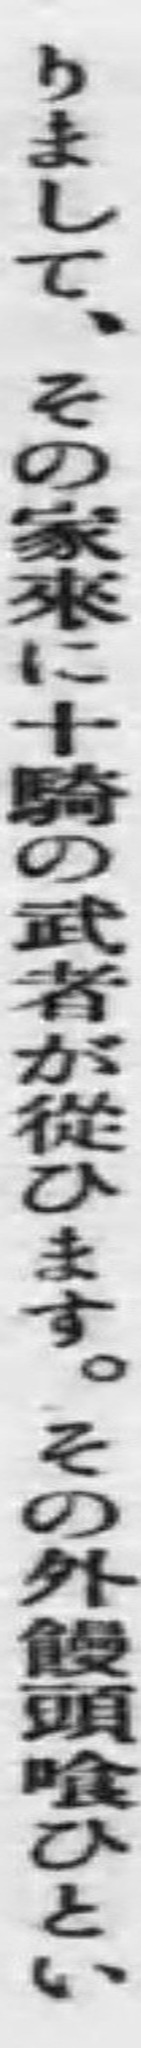りまして、その家来に十騎の武者が従ひます。その外饅頭喰ひとい
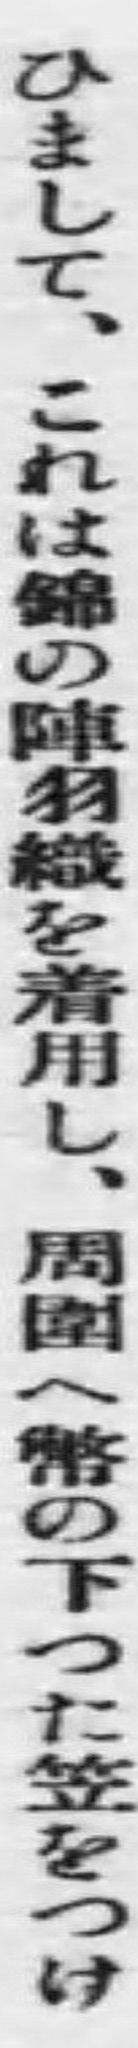ひまして、これは錦の陣羽織を着用し、周囲へ幣の下つた笠をつけ
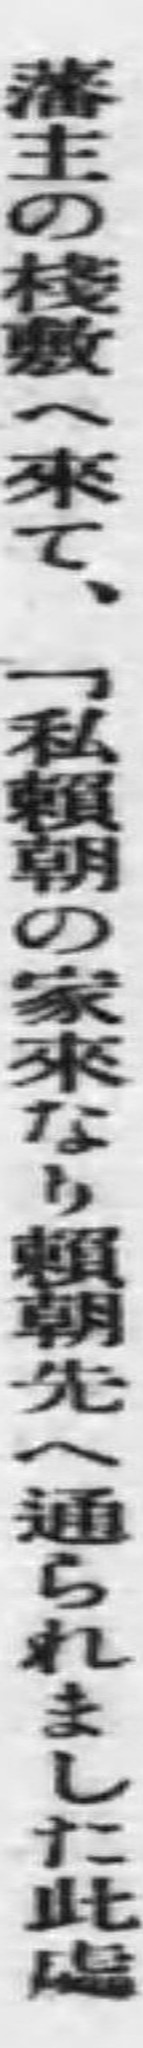藩主の桟敷へ来て、「私頼朝の家来なり頼朝先へ通られました此処

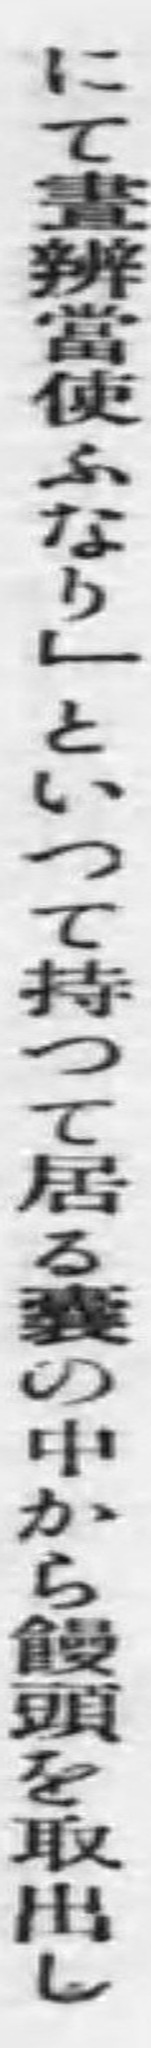にて昼弁当使ふなり」といつて持つて居る嚢の中から饅頭を取出し
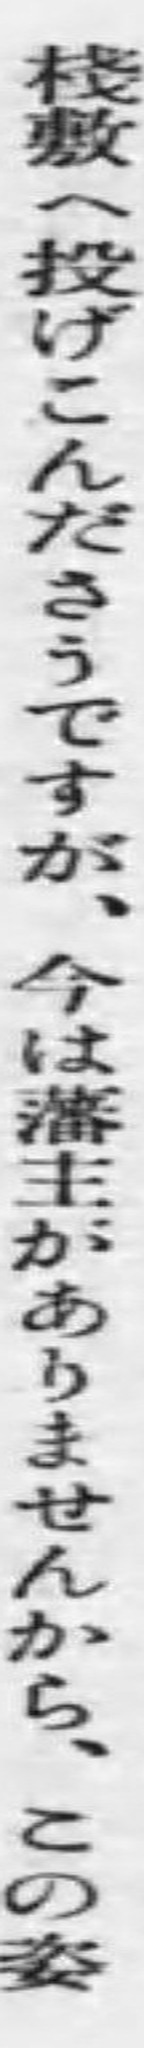桟敷へ投げこんださうですが、今は藩主がありませんから、この姿
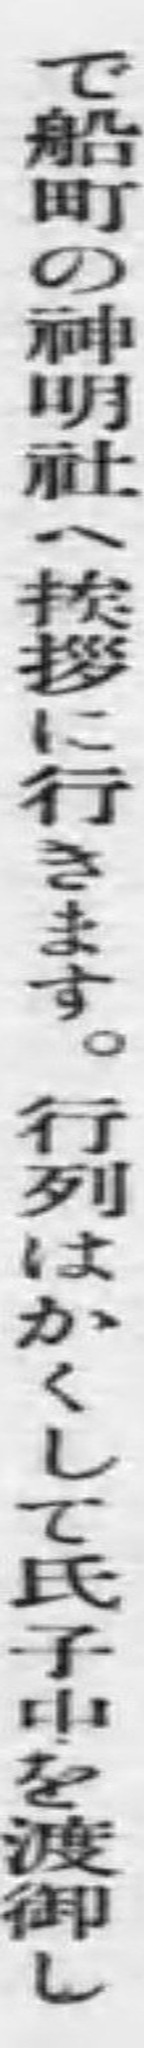で船町の神明社へ挨拶に行きます。行列はかくして氏子中を渡御し
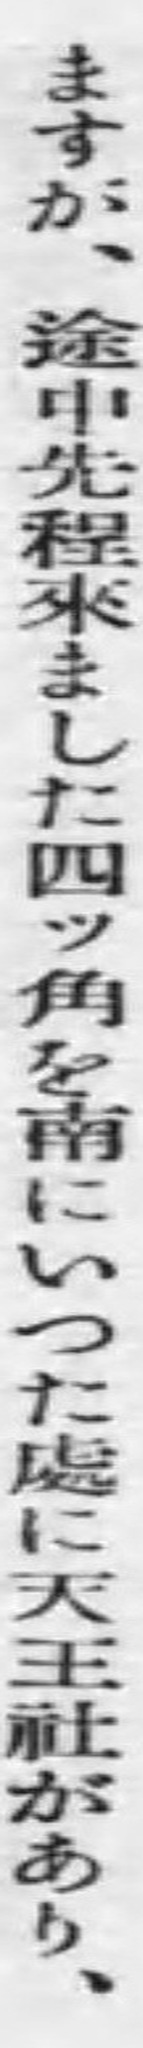ますが、途中先程来ました四ッ角を南にいつた処に天王社があり、
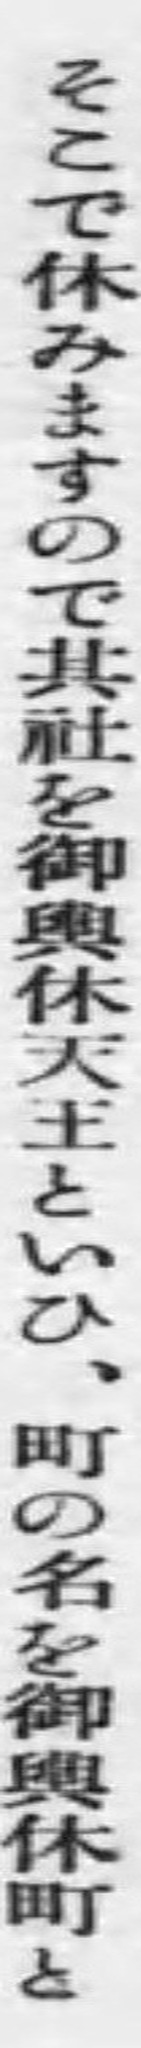そこで休みますので其社を御輿休天王といひ、町の名を御輿休町と
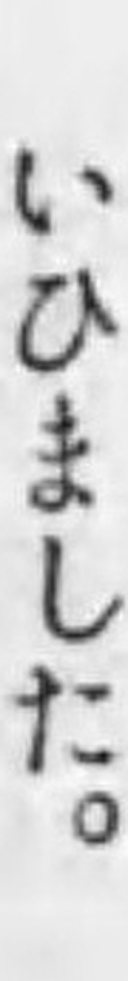いひました。
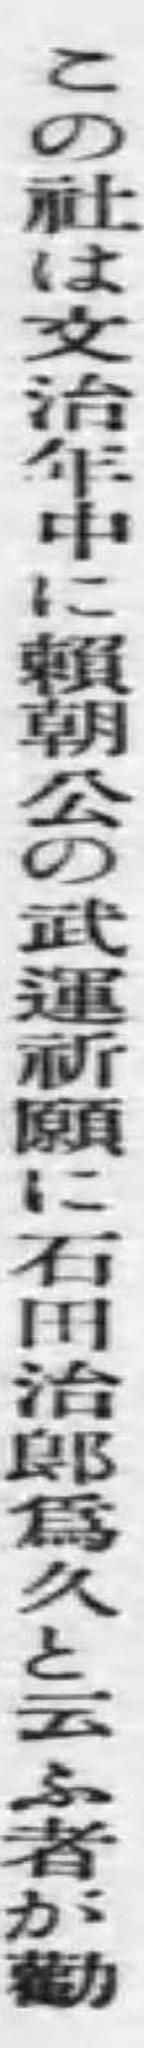この社は文治年中に頼朝公の武運祈願に石田治郎為久と云ふ者が勧
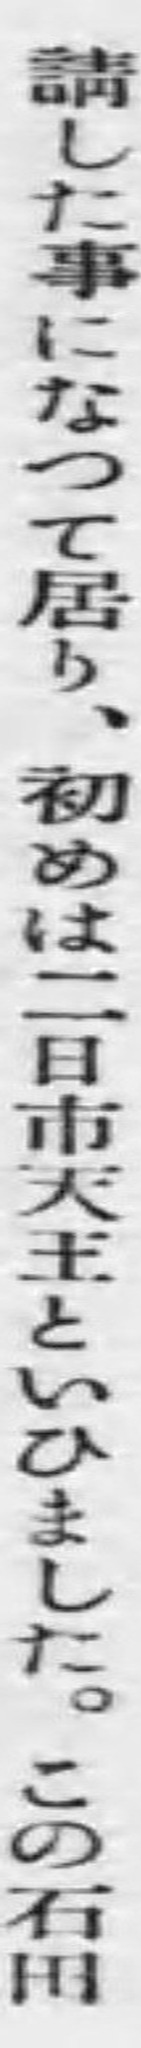請した事になつて居り、初めは二日市天王といひました。この石田
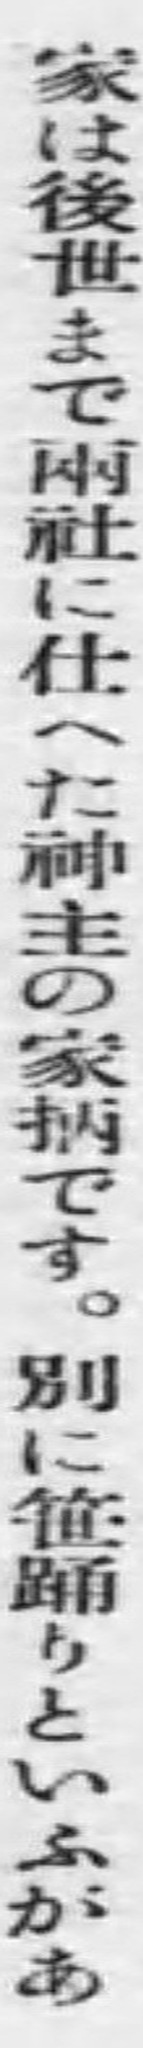家は後世まで両社に仕へた神主の家抦です。別に笹踊りといふがあ
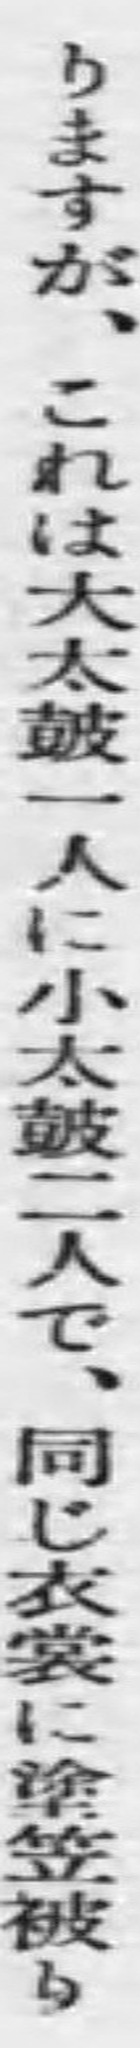りますが、これは大太鼓一人に小太鼓二人で、同じ衣裳に塗笠被り
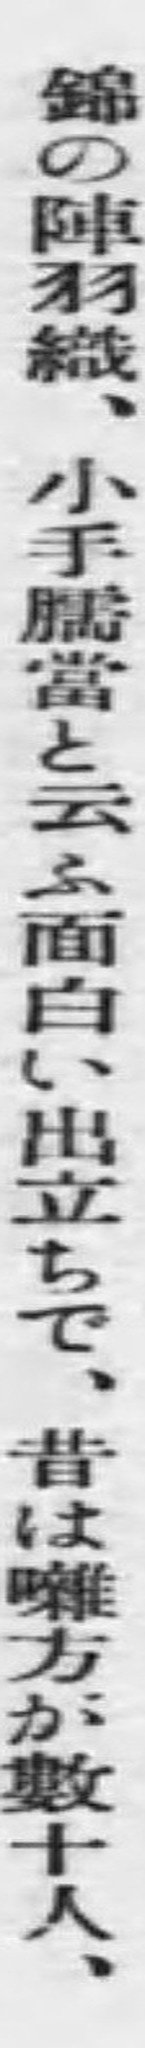錦の陣羽織、小手臑当と云ふ面白い出立ちで、昔は囃方が数十人、
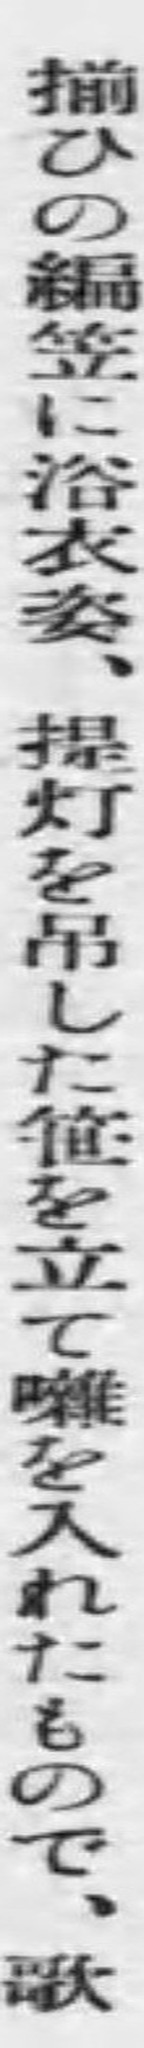揃ひの編笠に浴衣姿、提灯を吊した笹を立て囃を入れたもので、歌
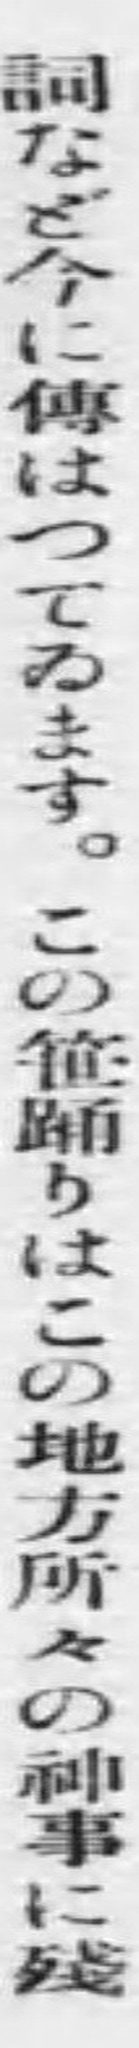詞など今に伝はつてゐます。この笹踊りはこの地方所々の神事に残
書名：東三河道中記 : 豊橋市及其附近案内
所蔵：国立国会図書館 National Diet Library, JAPAN
